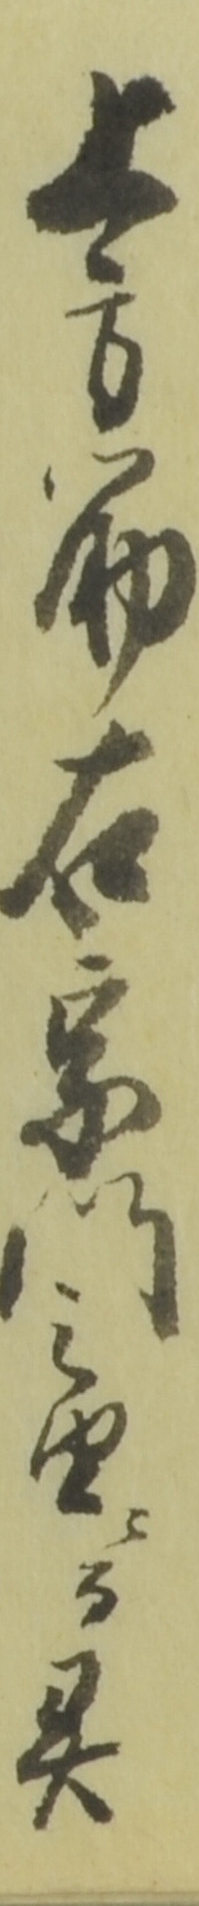上方筋右宗門之由ニ而異
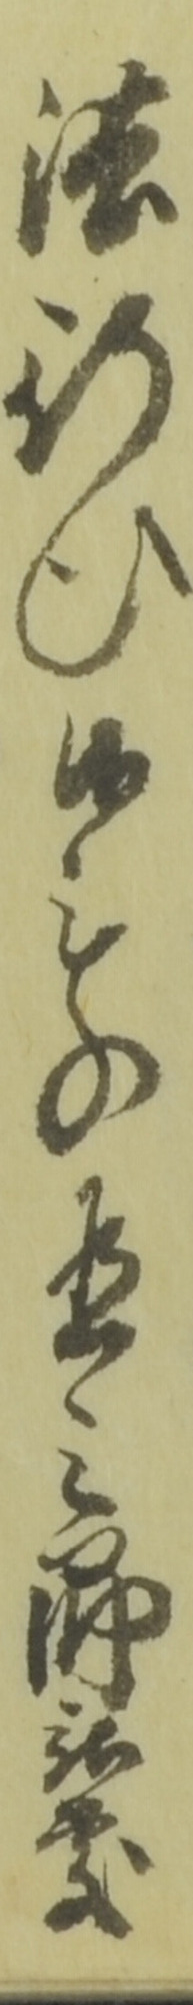法行ひ候もの有之筋被処
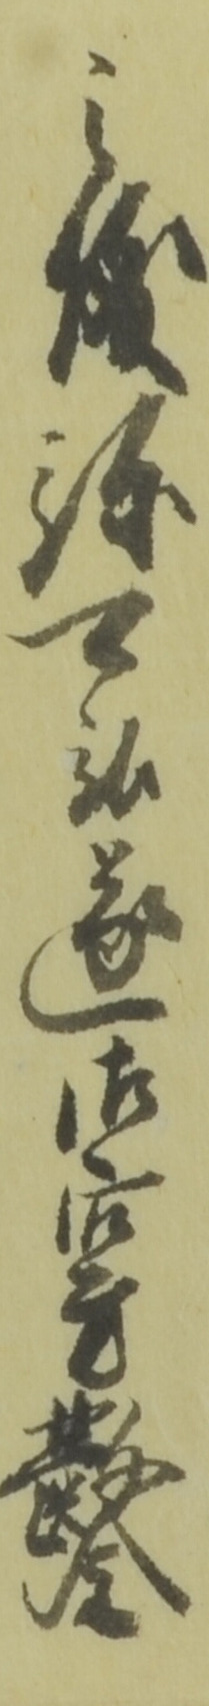之儀弥可被遂御穿鑿
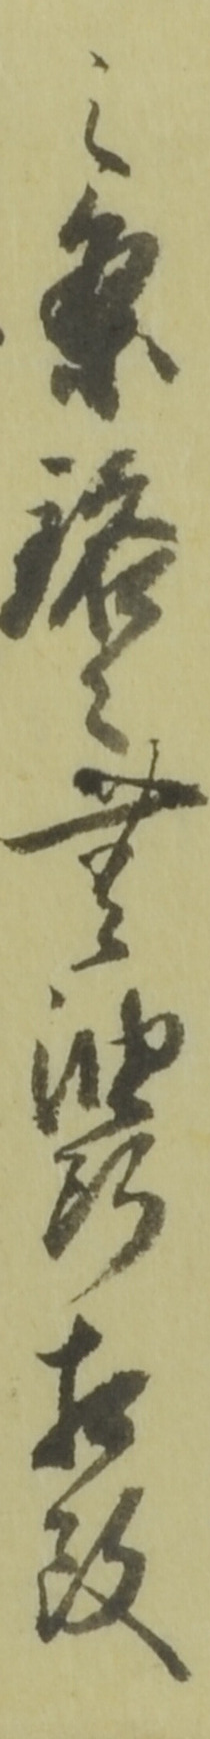之条銘々無油断相改
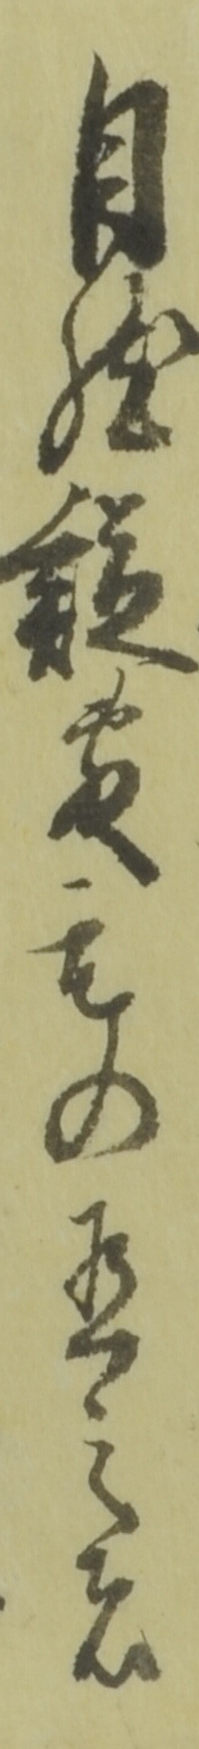自然難敷もの有之は
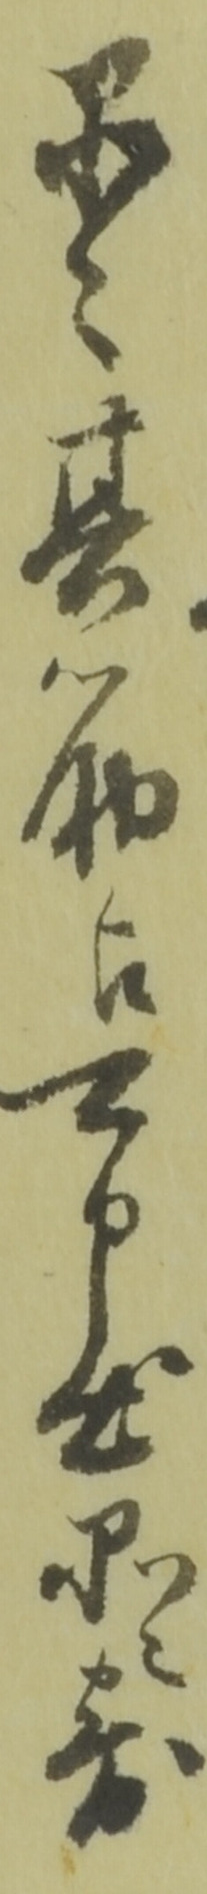早々其筋江可申出品ニ寄
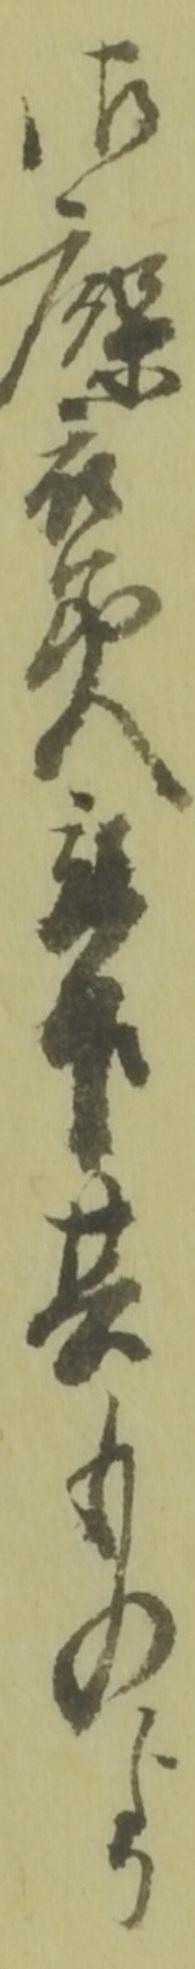御褒美被下其ものより
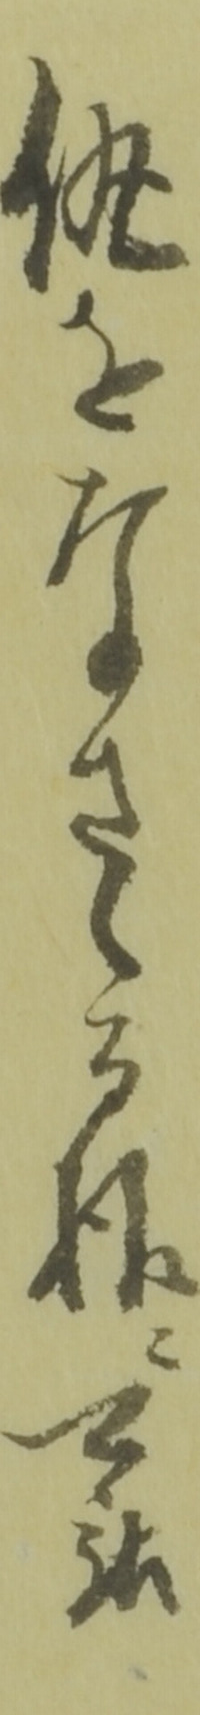仇をなさゝる様ニ可被
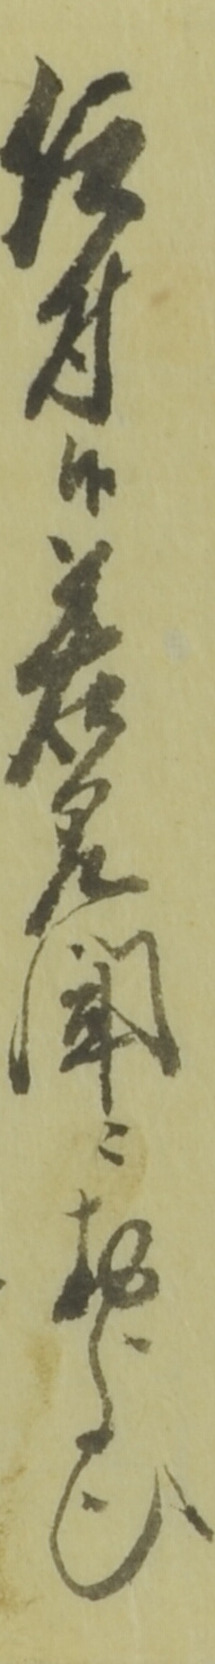仰付候若見聞ニおよひ
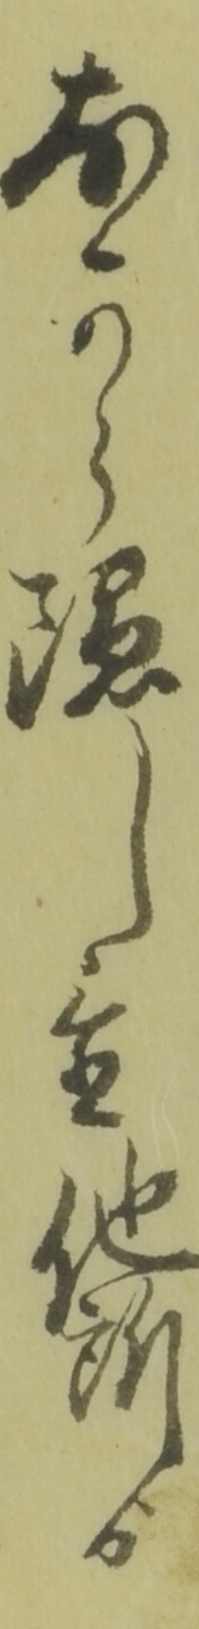なから隠し置他所ゟ
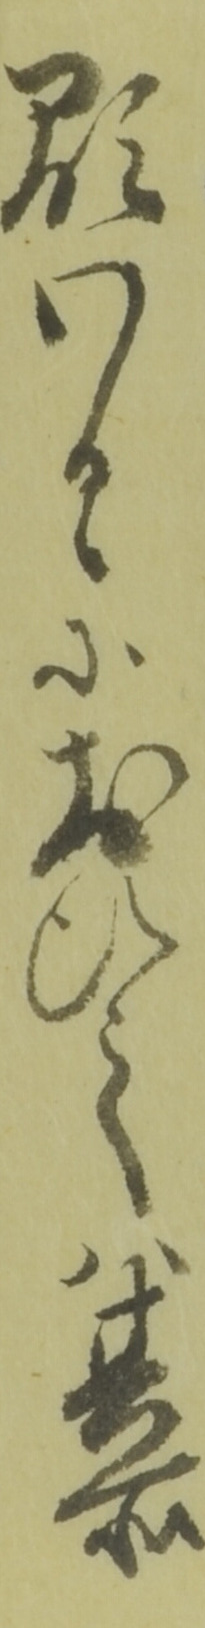顕ハるゝにおひてハ其所
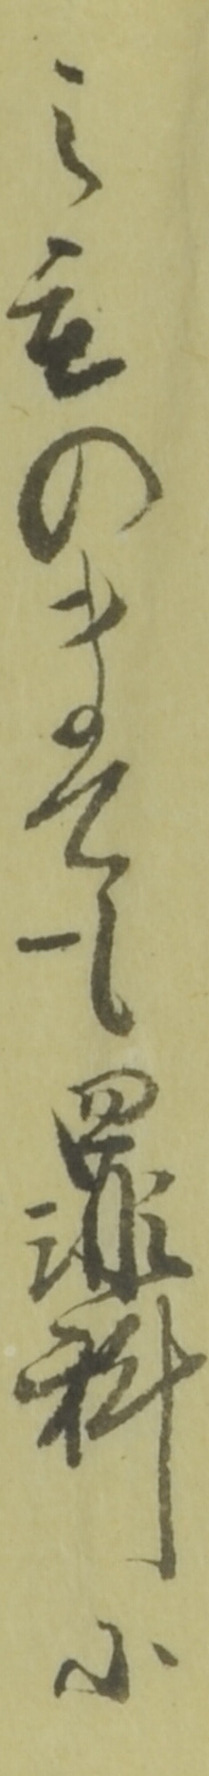之ものまても罪科に
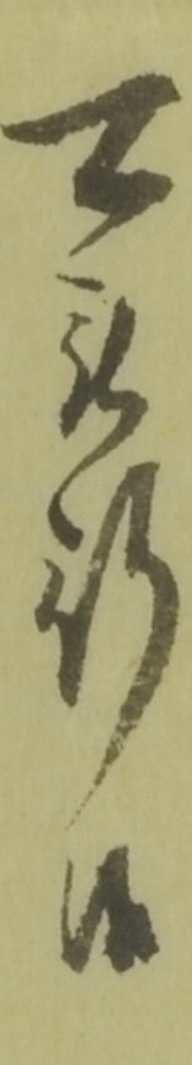可被行候
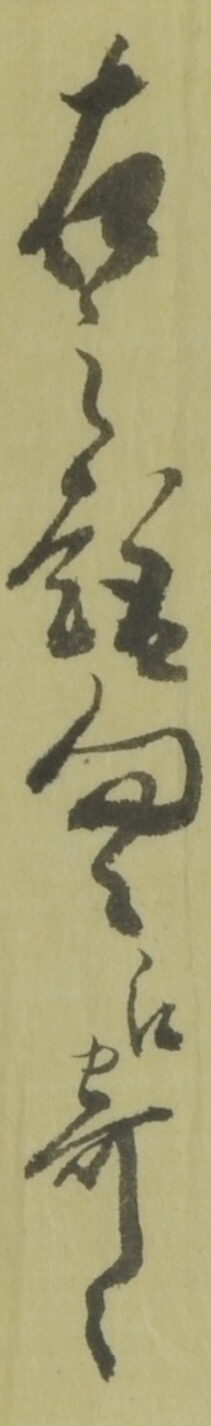右之趣向々江奇々
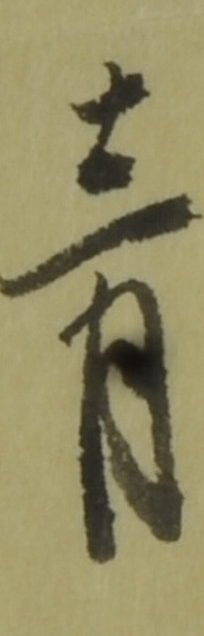十二月
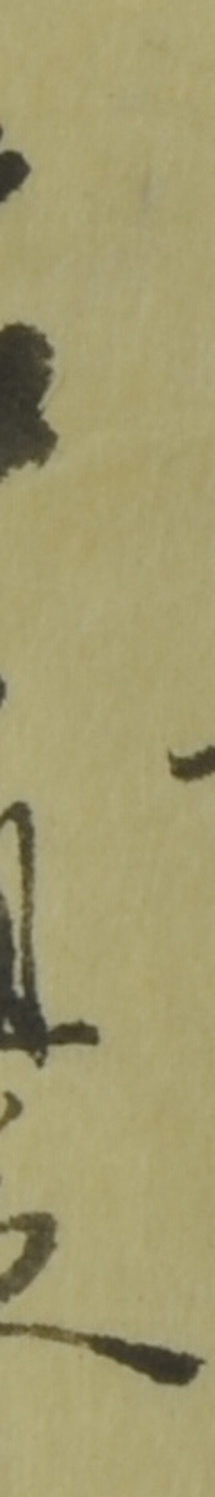右之通従
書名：御触書御書附控
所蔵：伊那市立高遠町図書館・合同会社AMANE
